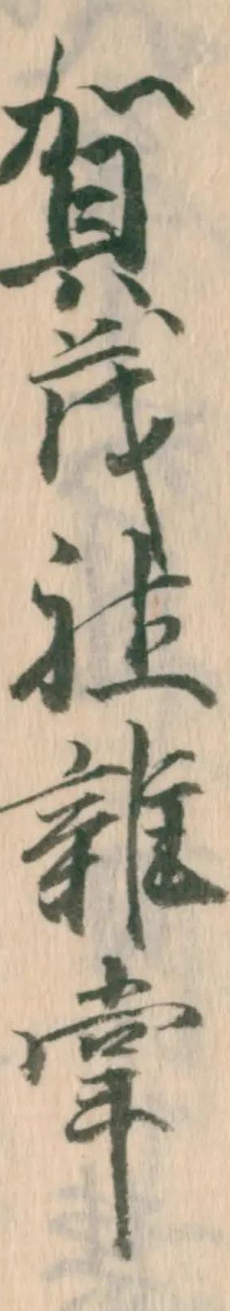賀茂社雑掌
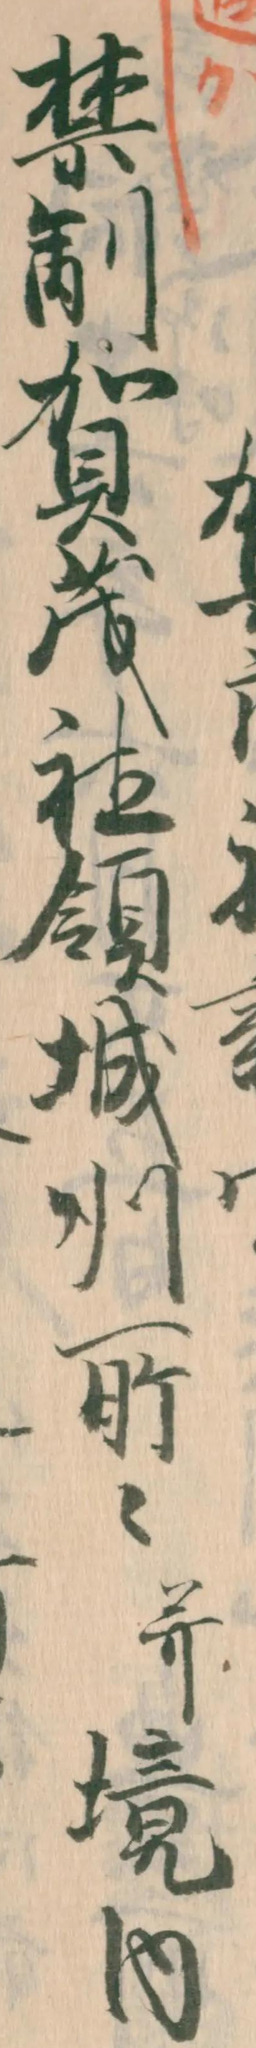禁制賀茂社領城州所々并境内
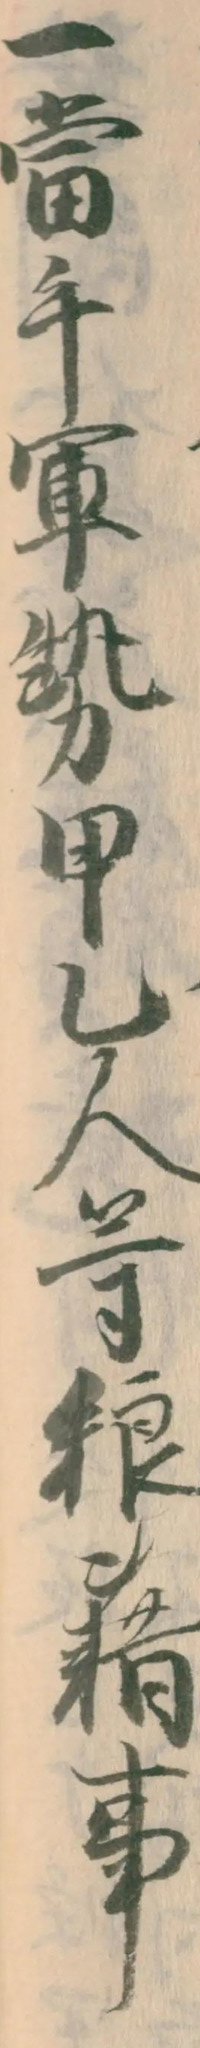一当手軍勢甲乙人等狼藉事
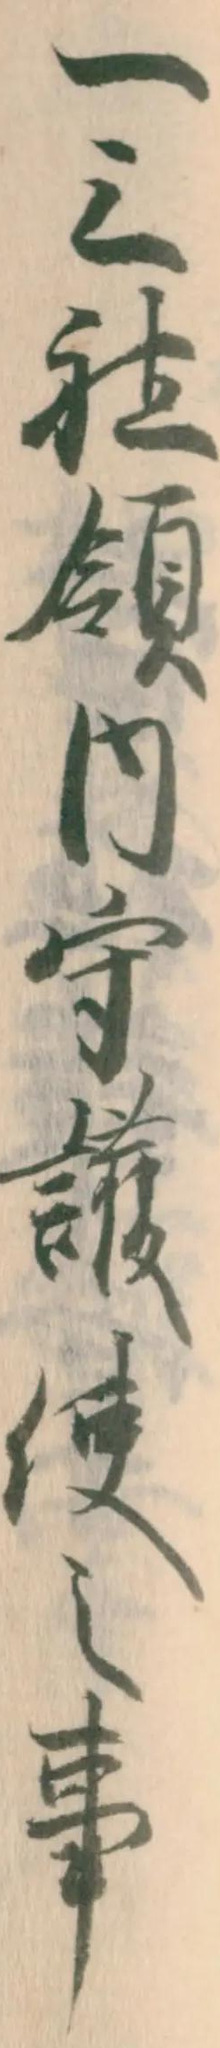一三社領内守護使之事
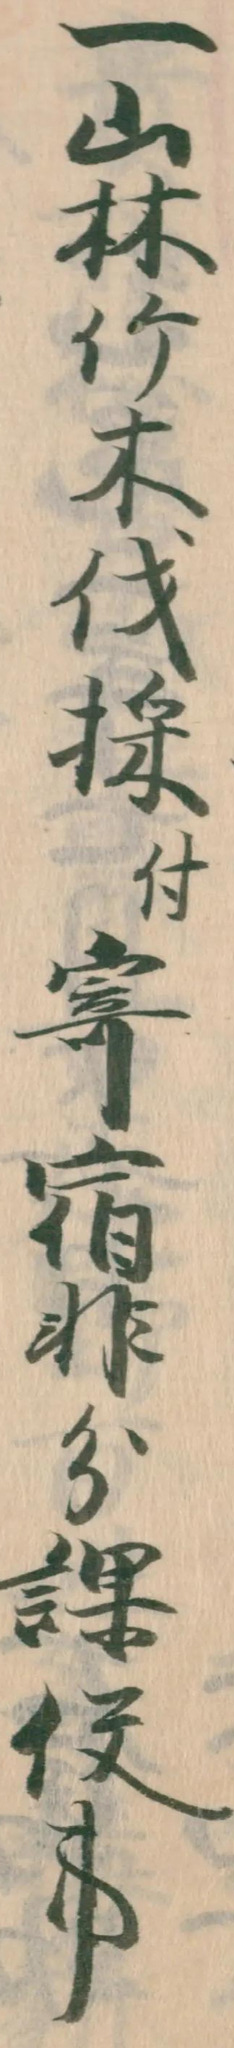一山林竹木伐採付寄宿非分課役事
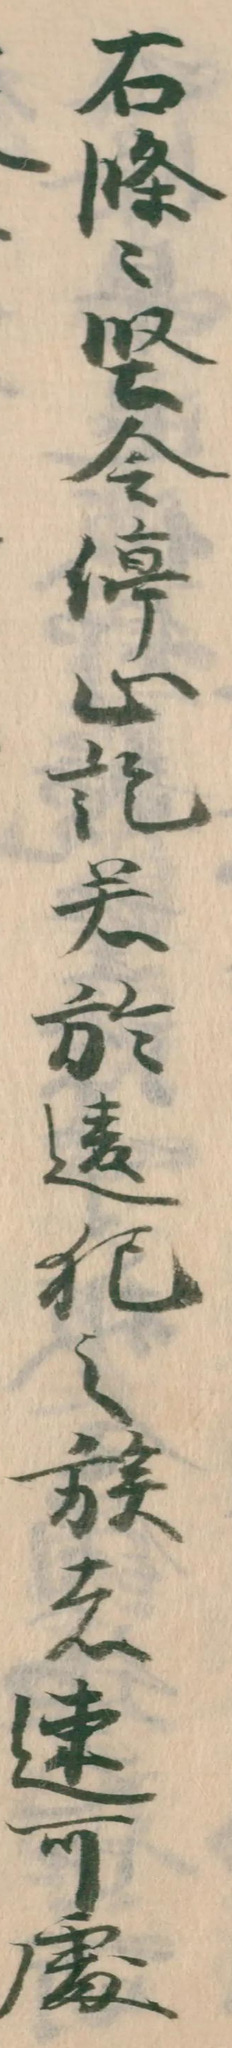右条々堅令停止訖若於違犯之族者速可処
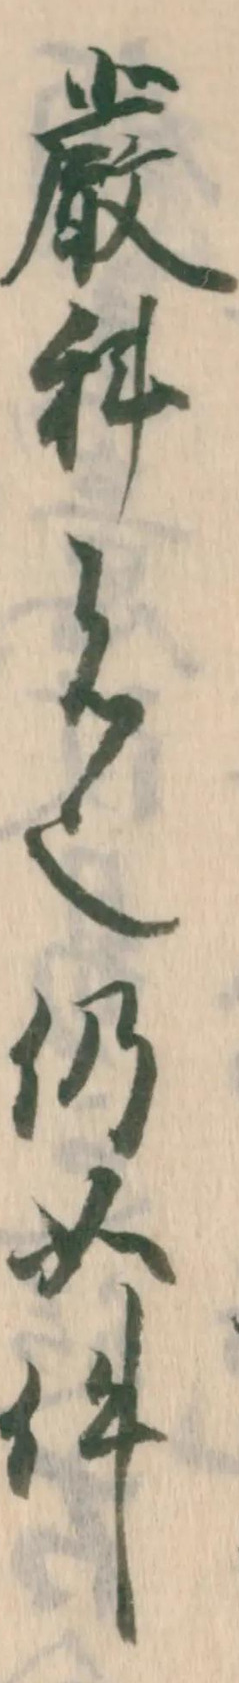厳科者也仍如件
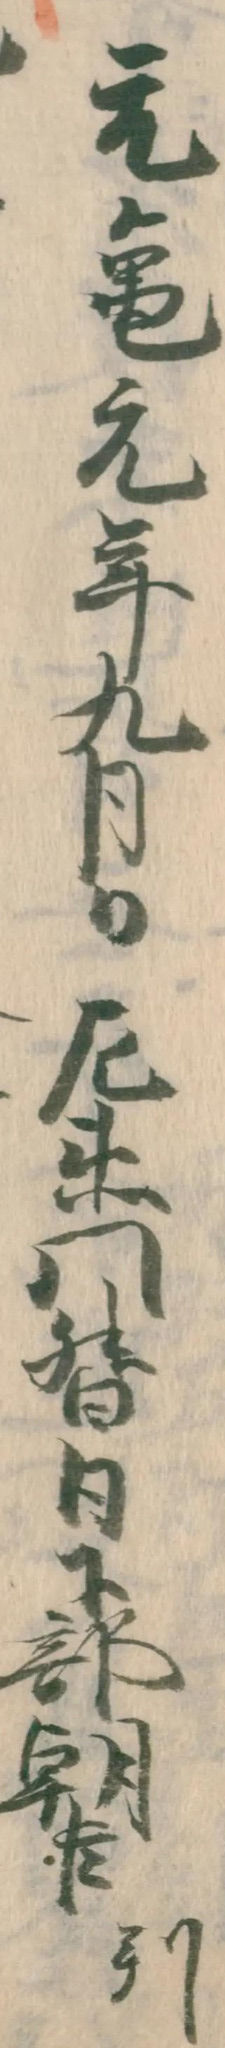元亀元年九月日左衛門督日下部朝臣判

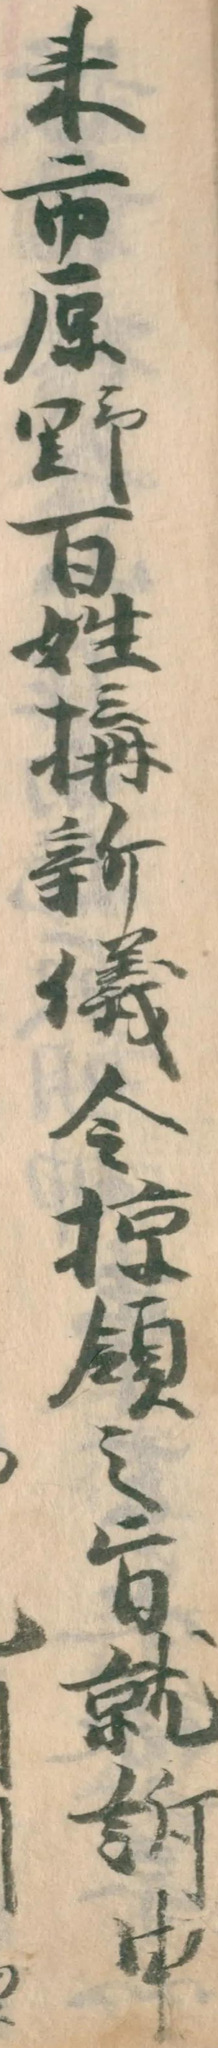来市原野百姓構新儀令掠領之旨就訴申
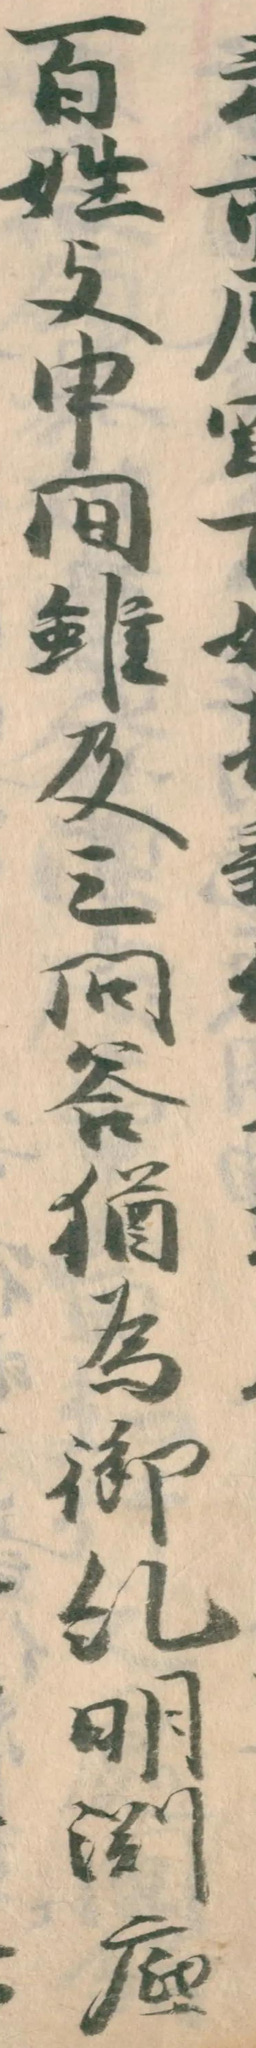百姓支申間雖及三問答猶為御糺明渕底
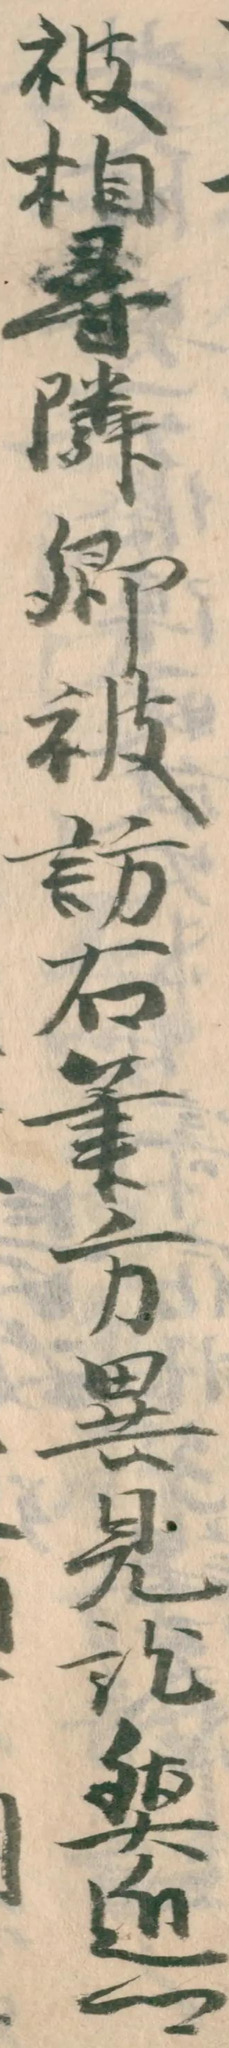被相尋隣郷被訪右筆方異見訖然近郷
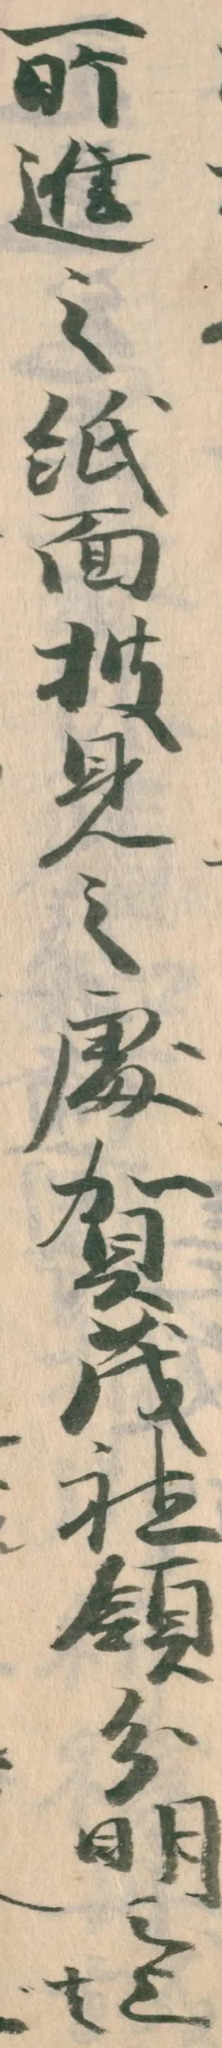所進之紙面披見之処賀茂社領分明之上者
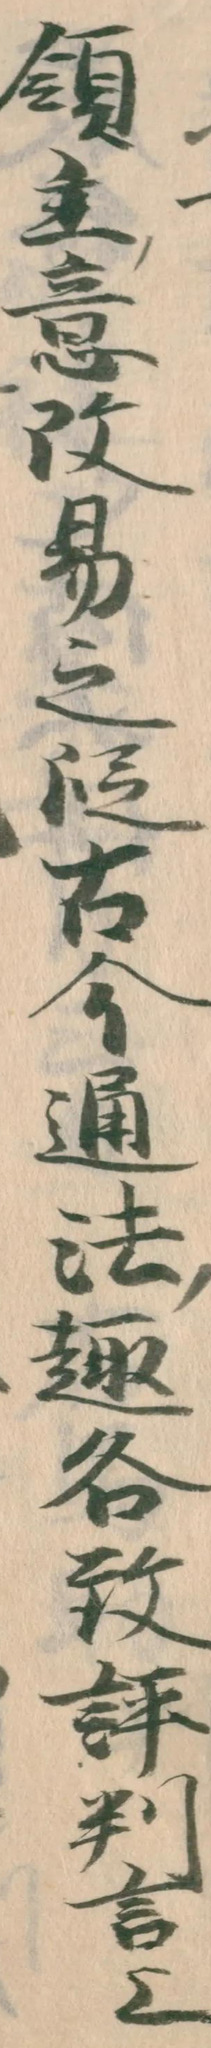領主意改易之段古今通法趣各致評判言上
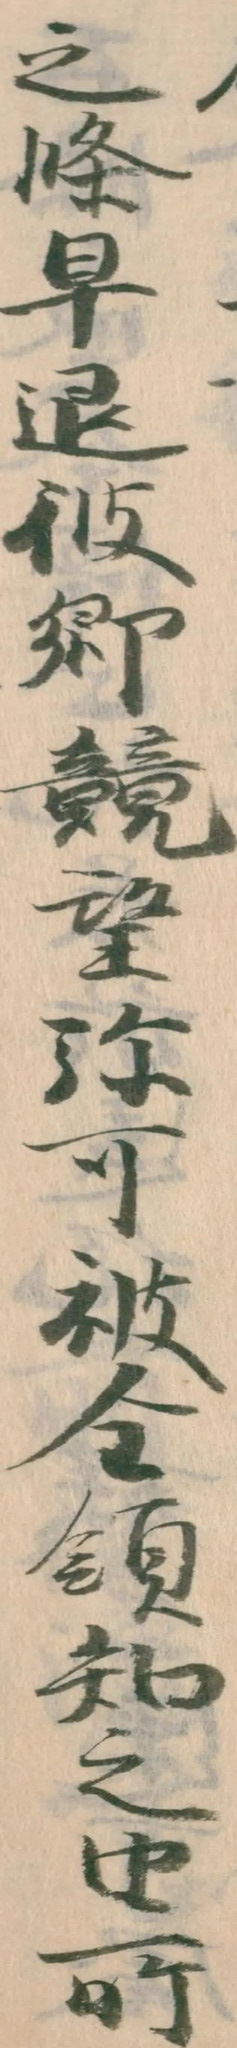之条早退彼郷競望弥可被全領知之由所
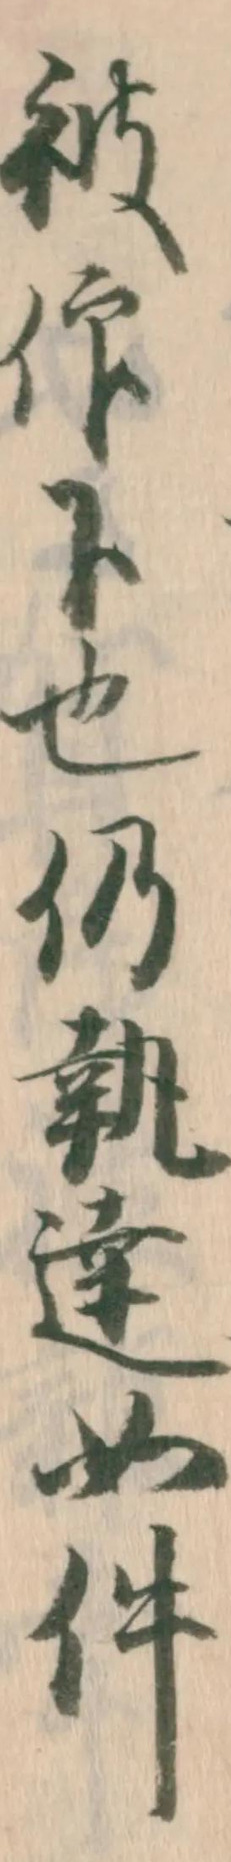被仰下也仍執達如件
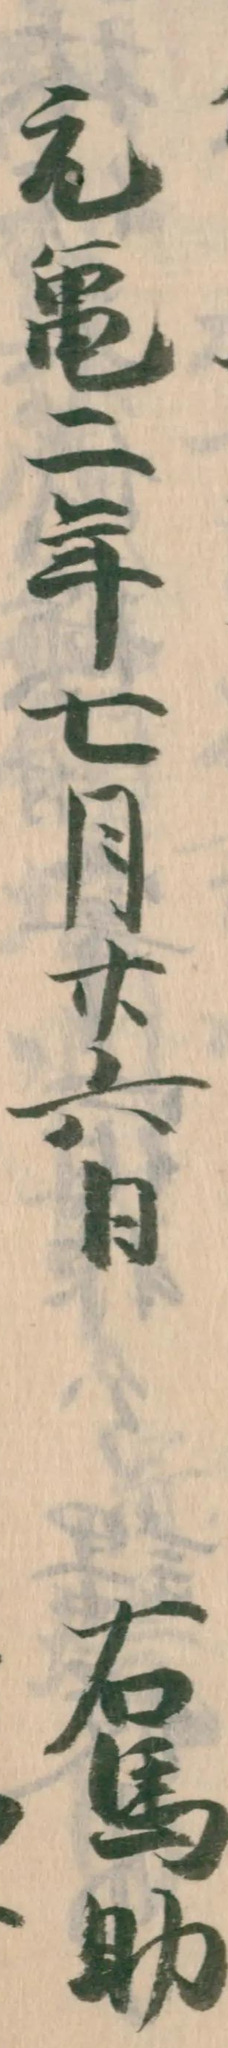元亀二年七月廿六日右馬助判
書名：賀茂社記録. 第1冊
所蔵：国立国会図書館 National Diet Library, JAPAN
